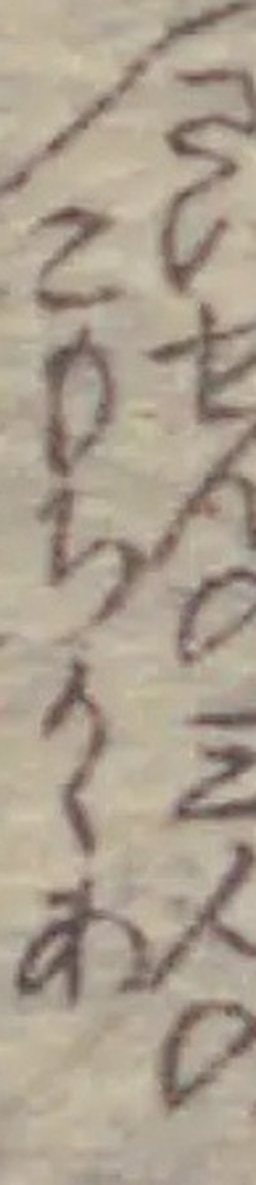こもちかゝあ
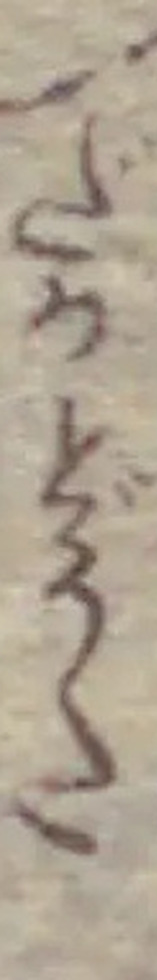たかどうた
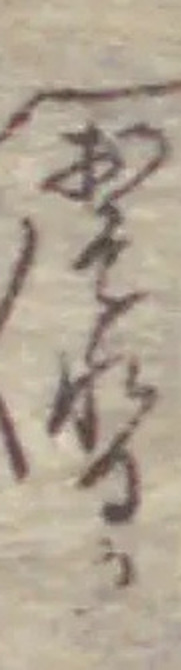おそれるか
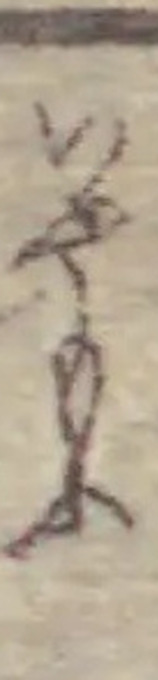いやもふ
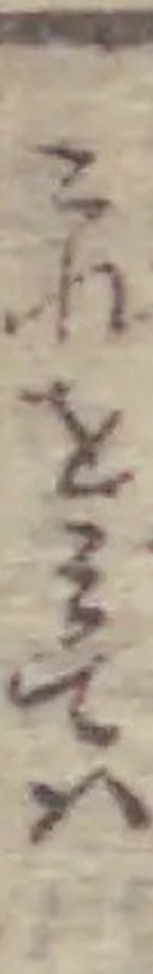これをみては
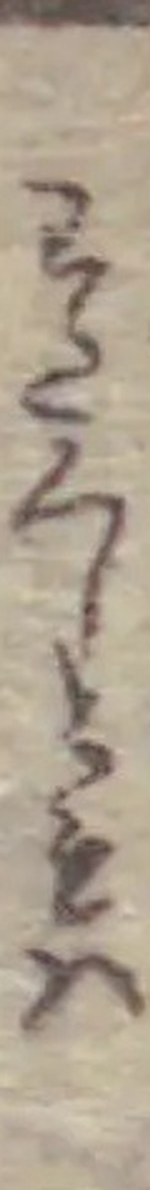わたくしともは
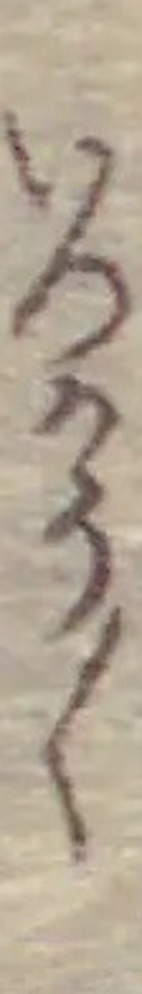いつかう〳〵
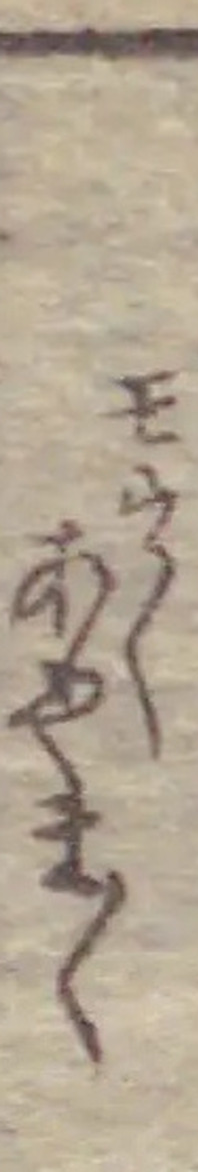あやま〳〵
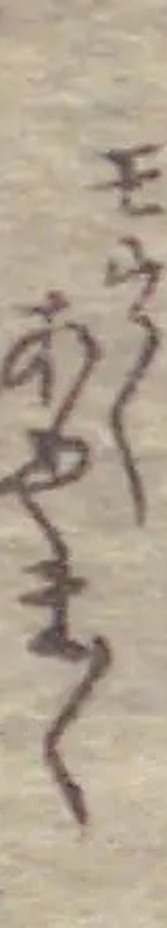あやま〳〵
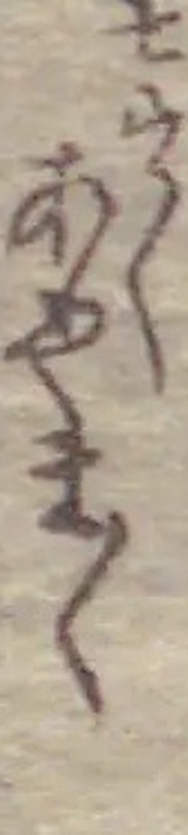あやま〳〵
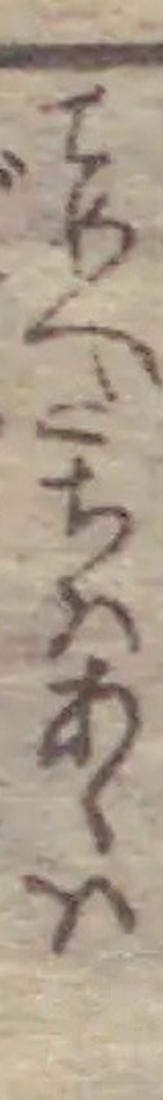てめへたちはあゝは

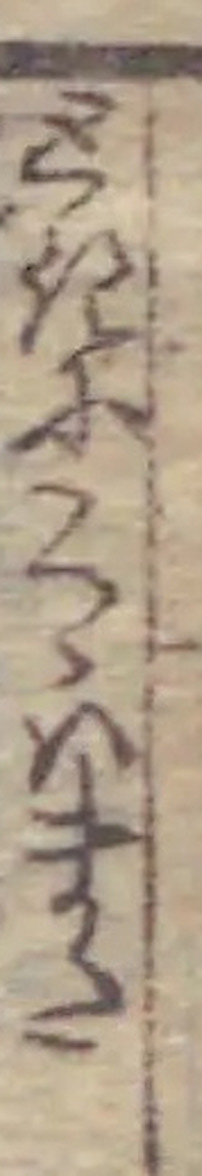ときにこゝはまた
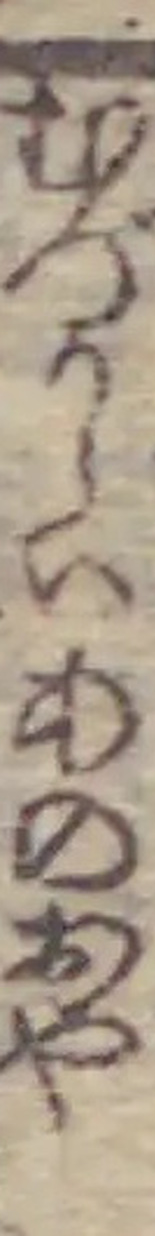むつかしいあのおや
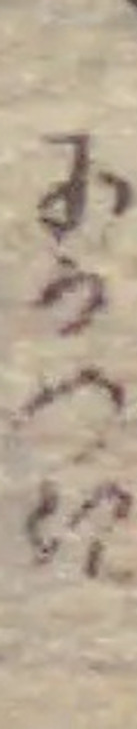にかつき
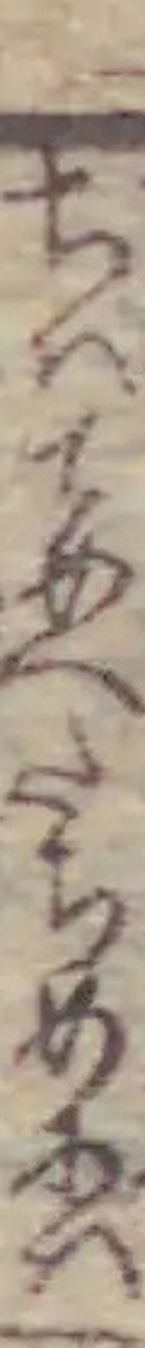ちはてめへたちめには
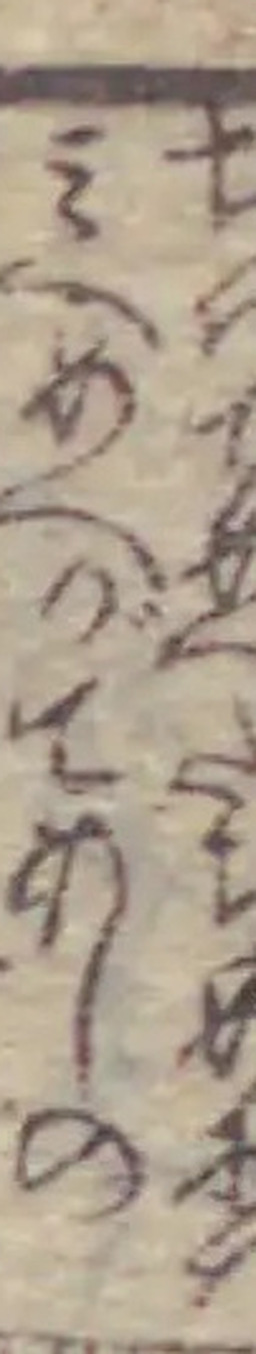みへめへがてあしの
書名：化物大閉口 2巻
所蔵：国立国会図書館 National Diet Library, JAPAN
